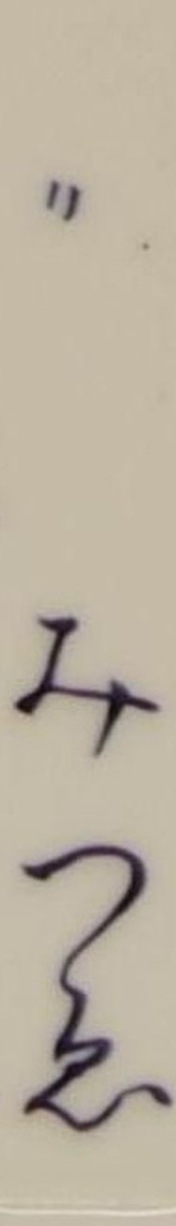みつゑ
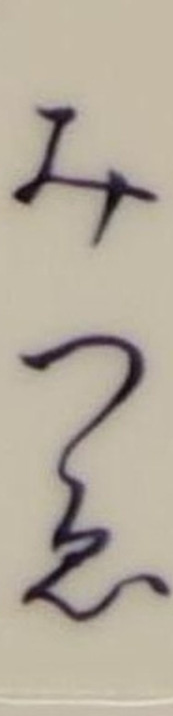みつゑ
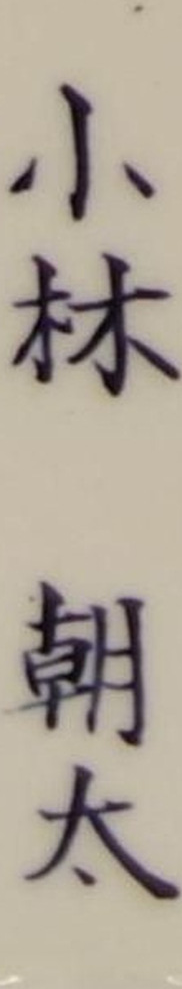小林朝太
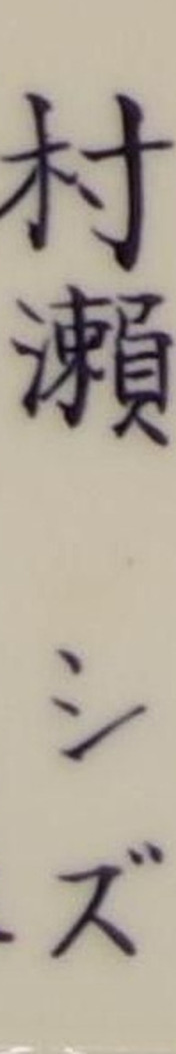村瀬シズ
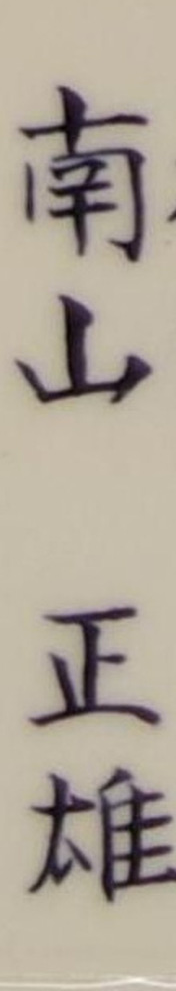南山正雄

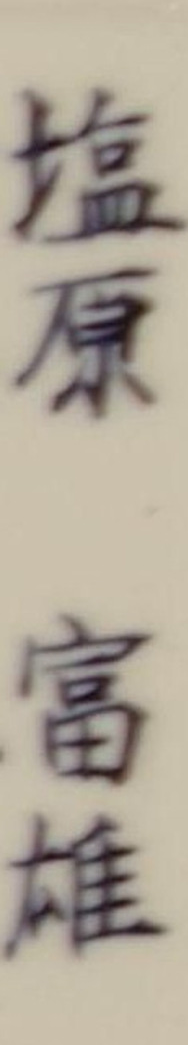塩原富雄
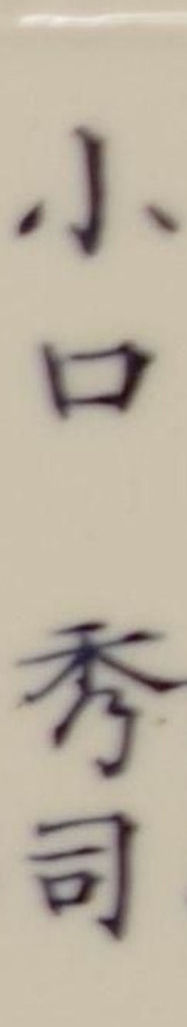小口秀司
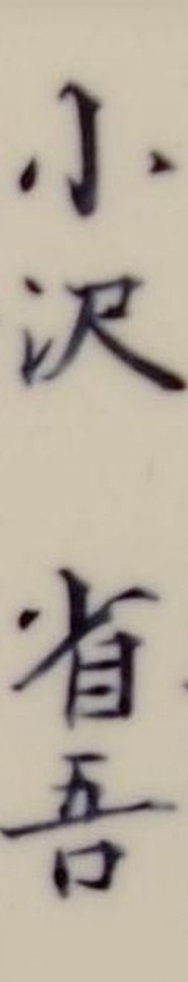小沢省吾
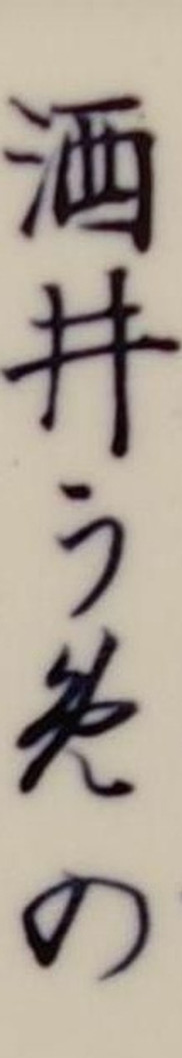酒井うめの
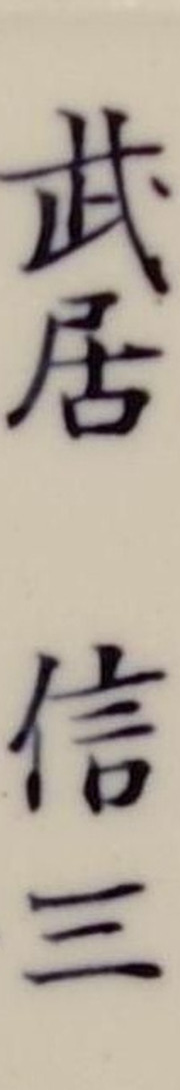武居信三
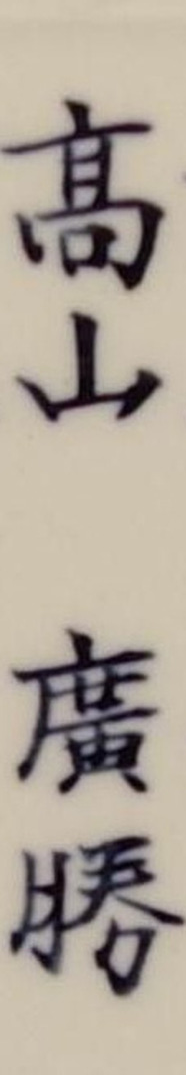高山広勝
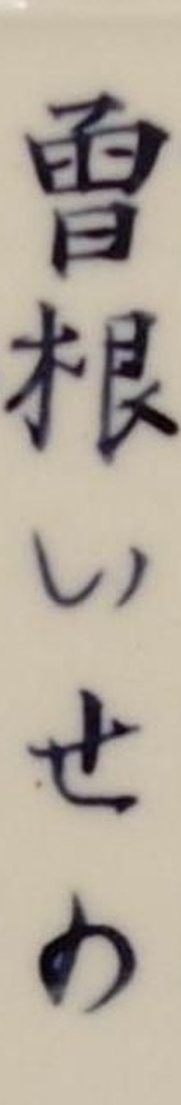曽根いせの
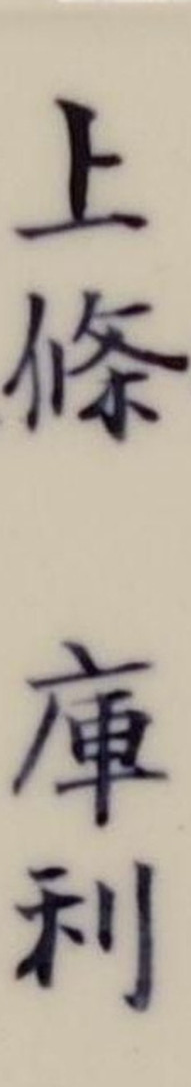上條庫利
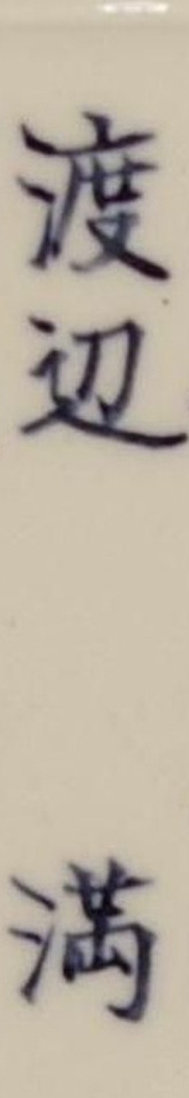渡辺満
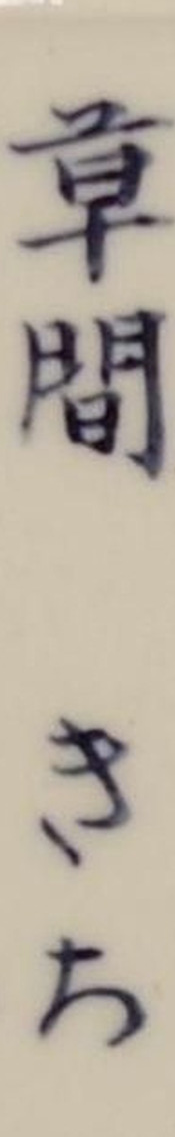草間きち
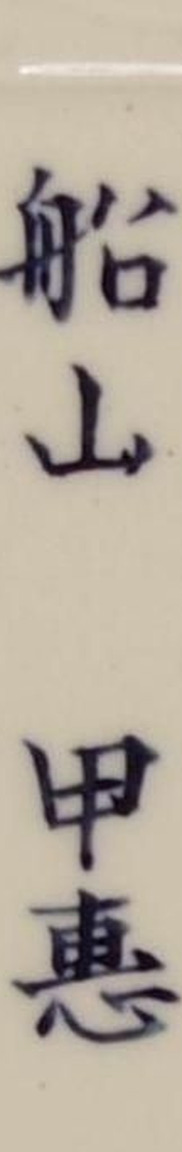船山甲恵
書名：M~S
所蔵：高野山金剛峯寺
